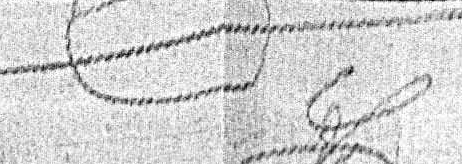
xx
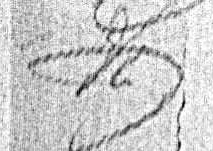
xx
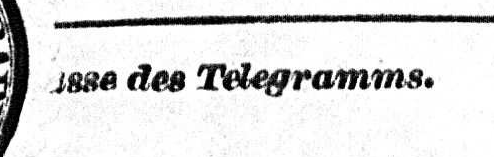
xx des Telegramms.
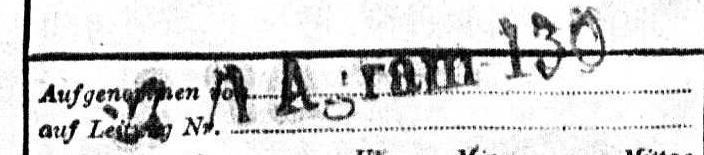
Aufgenommen von..........................................................................
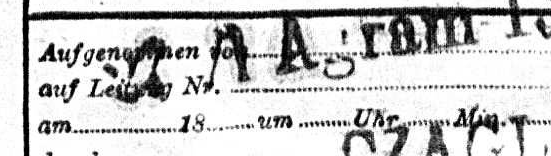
auf Leitung Nr..................................................................................
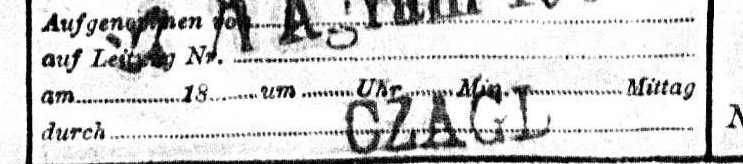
am...........18......um............Uhr..............Min........................ Mittag
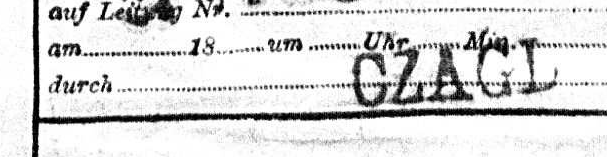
durch......................Czagl.............................................................................
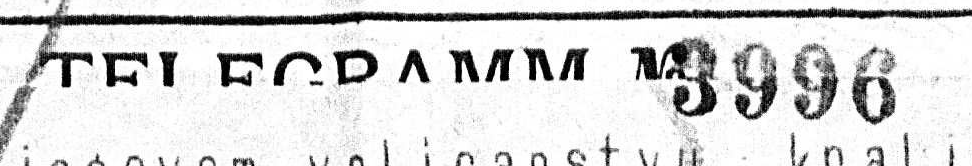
Telegramm No. 3996
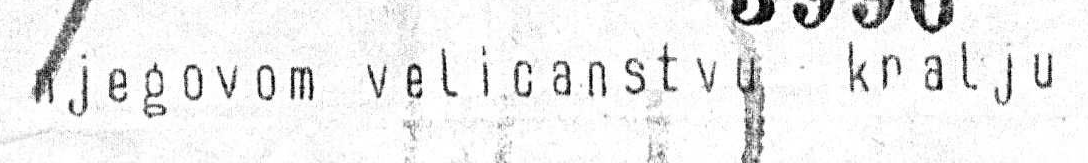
njegovom velicanstvu kralju
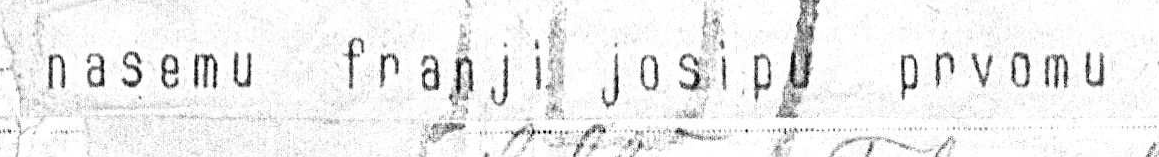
nasemu franji josipu prvomu
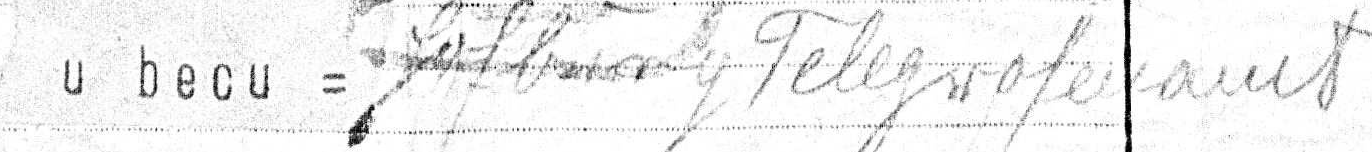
u becu = xx Telegrafenamt
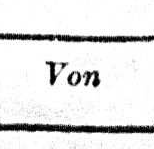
Von
